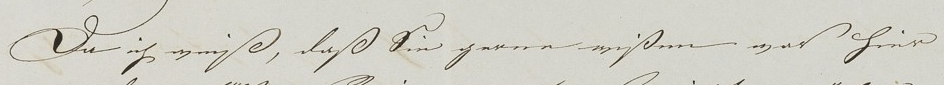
Da ich weiß, daß Sie gerne wißen was hier
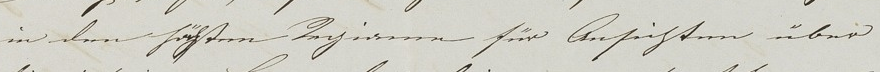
in den höchsten Regionen für Ansichten über
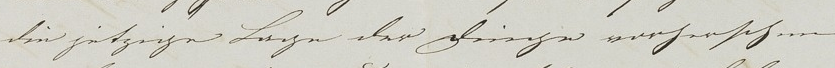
die jetzige Lage der Dinge vorherschen,
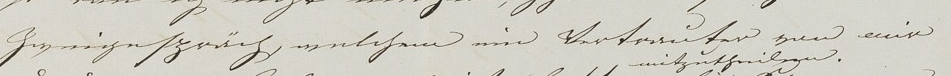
Zweigespräch, welchem ein Vertrauter von mir
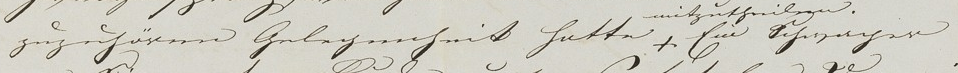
zuzuhören Gelegenheit hatte mitzutheilen. Ein Schwager
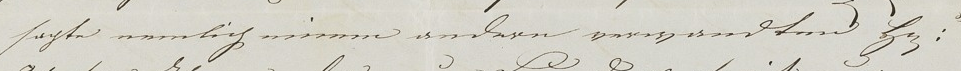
sagte nemlich einem andern verwandten Herrn:«
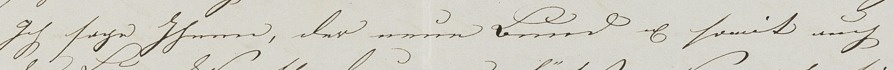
Ich sage Ihnen, der neue Bund & somit auch
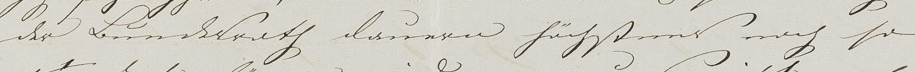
der Bundesrath dauern höchstens noch so
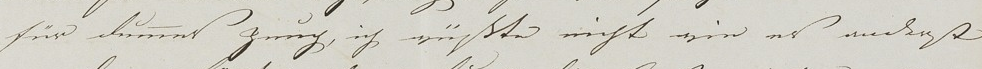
für dummes Zeug, ich wüßte nicht wie es anderst
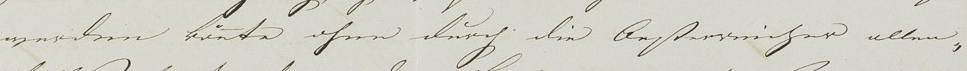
werden könnte ohne durch die Oesterreicher allen-
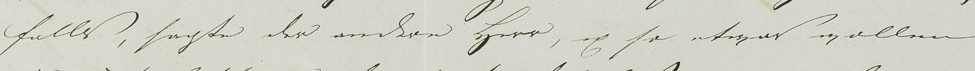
falls, sagte der andere Herr, & so etwas wollen
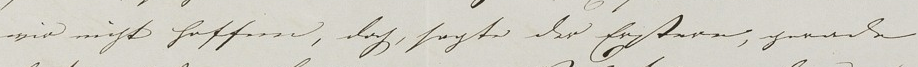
wir nicht hoffen, doch, sagte der Erstere, gerade
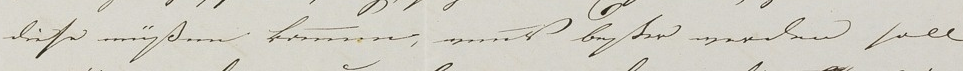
diese müßen kommen, wenns beßer werden soll
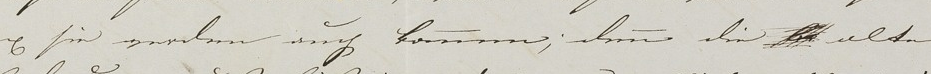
& sie werden auch kommen; denn die ... alte
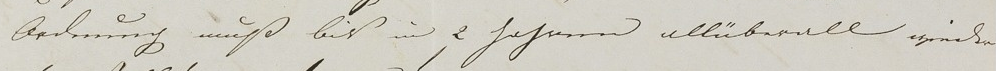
Ordnung muß bis in 2 Jahren allüberall wieder
